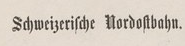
Schweizerische Nordostbahn.
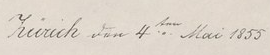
Zürich den 4ten Mai 1855
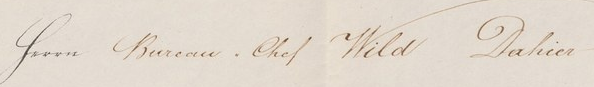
Herrn Bureau-Chef Wild Dahier.
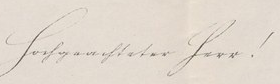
Hochgeachteter Herr!
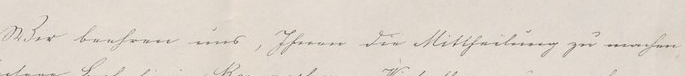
Wir beehren uns, Ihnen die Mittheilung zu machen,
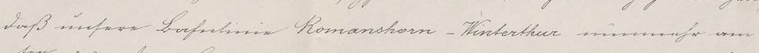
daß unsere Bahnlinie Romanshorn–Winterthur nunmehr am
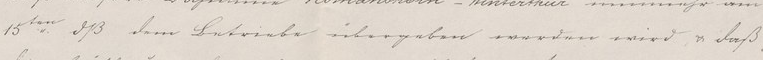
15ten dß dem Betriebe übergeben werden wird, & daß
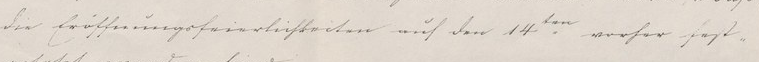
die Eröffnungsfeierlichkeiten auf den 14ten vorher fest-
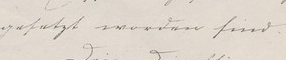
gesetzt worden sind.
